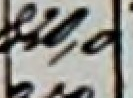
820,0
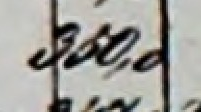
350,0
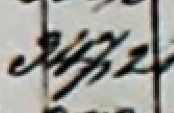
347,2
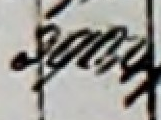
390,4
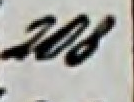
208
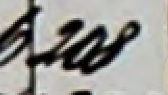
208
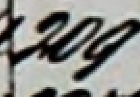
209
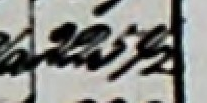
225½
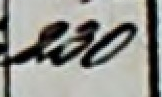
230
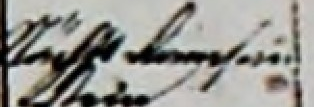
Nächst Ramsau
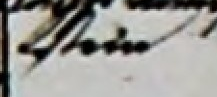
stein
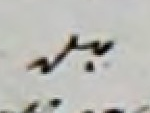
do
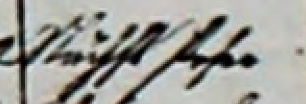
Nächst Poser
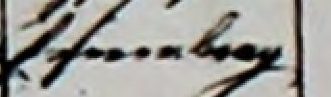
Posererberg
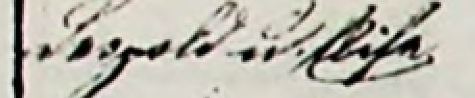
Leopold u. Elise
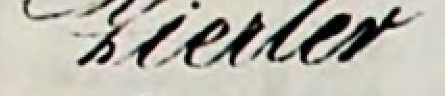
Zierler
